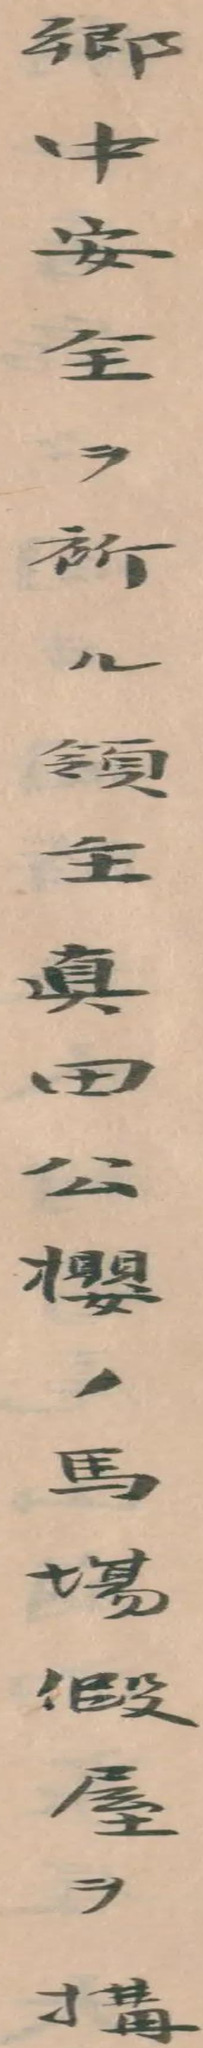郷中安全ヲ祈ル領主真田公桜ノ馬場仮屋ヲ構
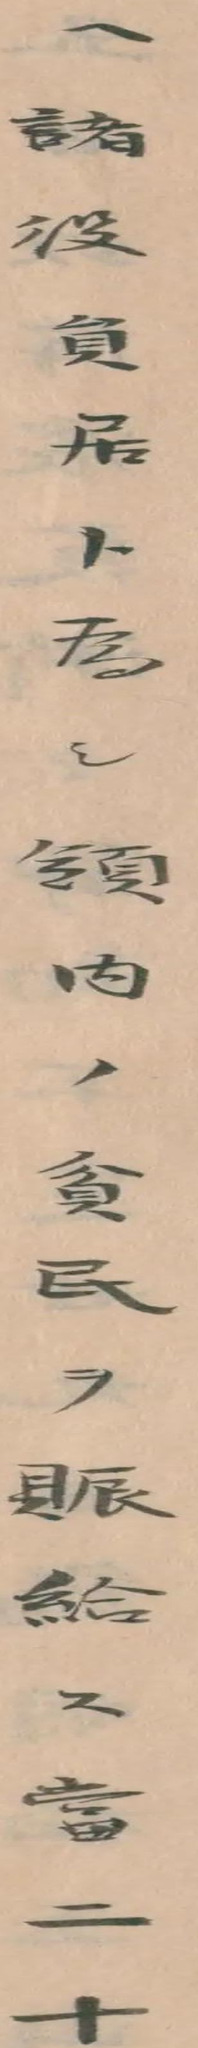ヘ諸役員居ト為シ領内ノ貧民ヲ賑給ス当二十

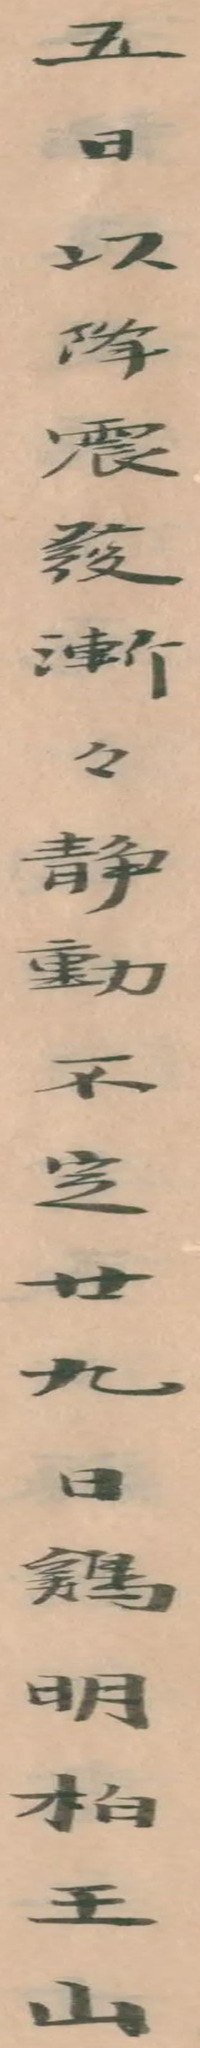五日以降震発漸々静動不定廿九日鶏明柏王山
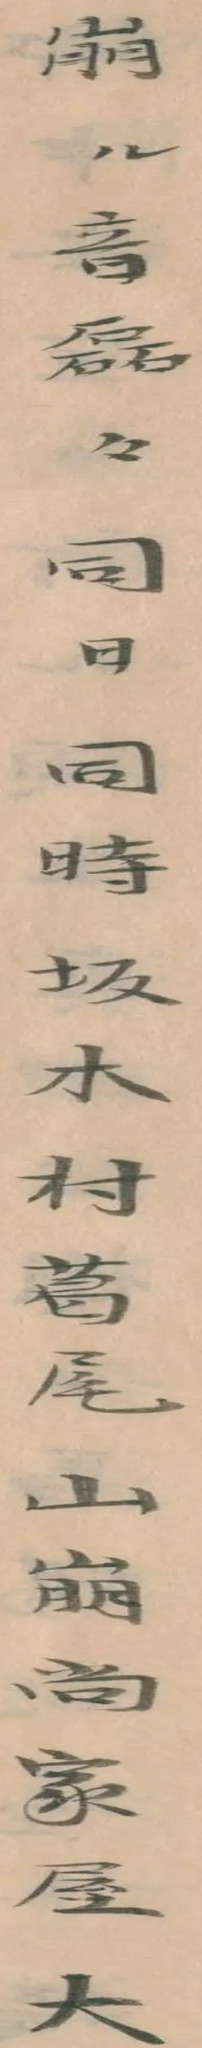崩ル音磊々同日同時坂木村葛尾山崩尚家屋大
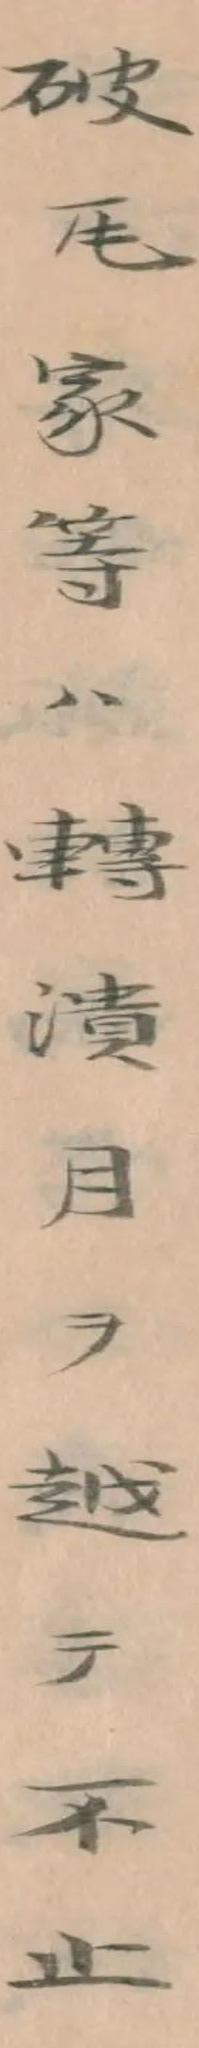破厇家等ハ転潰月ヲ越テ不止
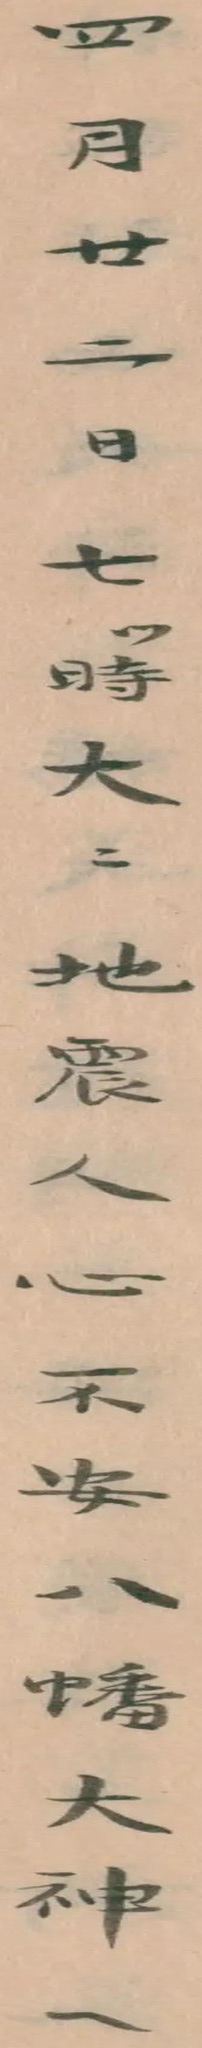四月廿二日七ツ時大ニ地震人心不安八幡大神ヘ
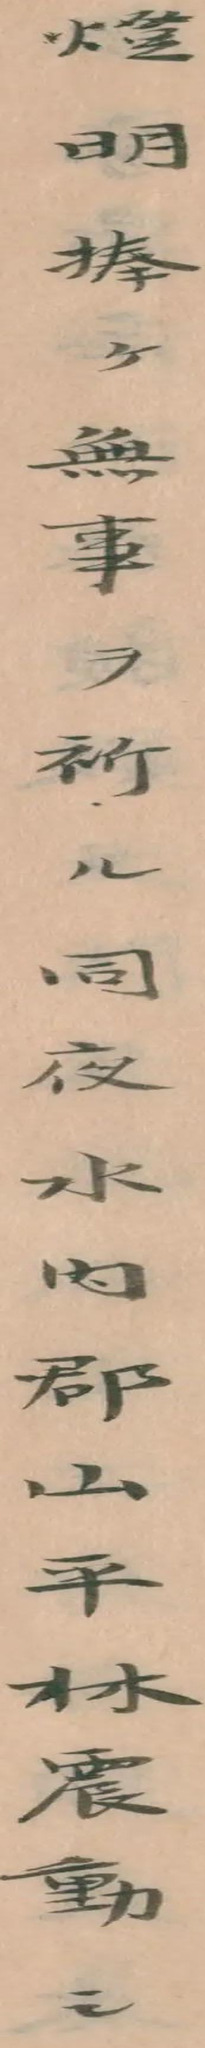燈明捧ケ無事ヲ祈ル同夜水内郡山平林震動シ
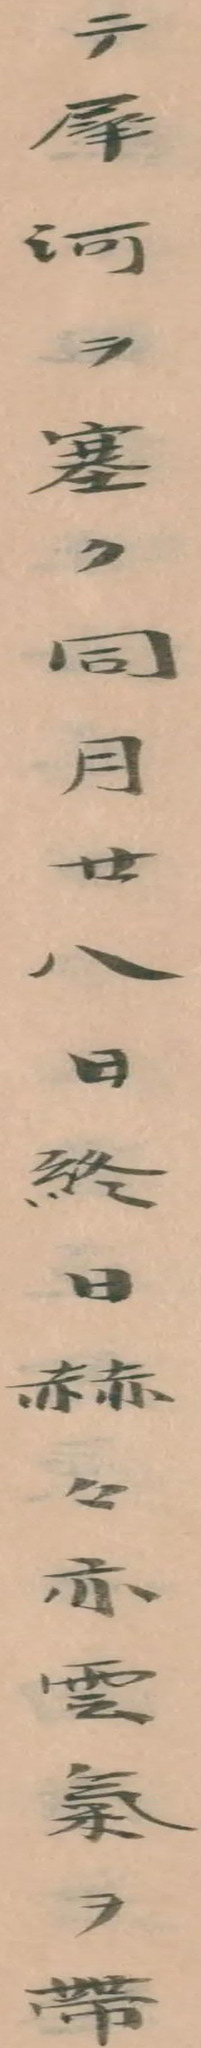テ犀河ヲ塞ク同月廿八日終日赫々亦雲気ヲ帯
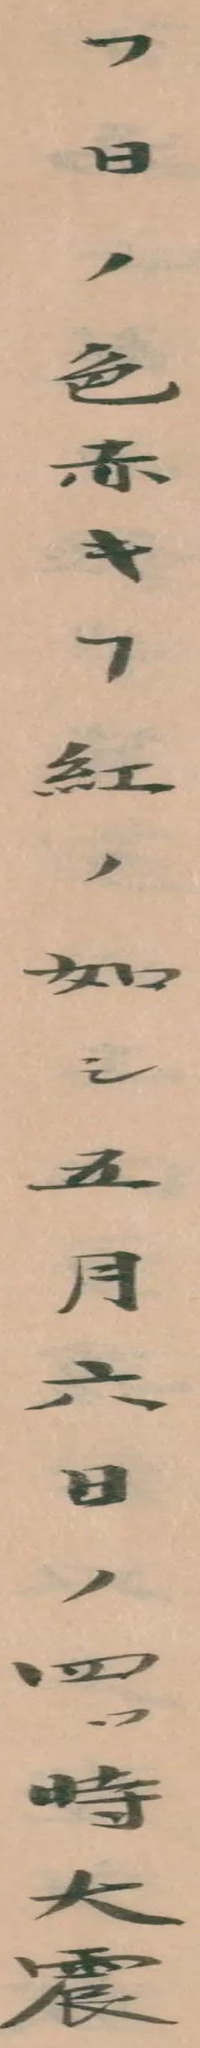フ日ノ色赤キコト紅ノ如シ五月六日ノ四ツ時大震
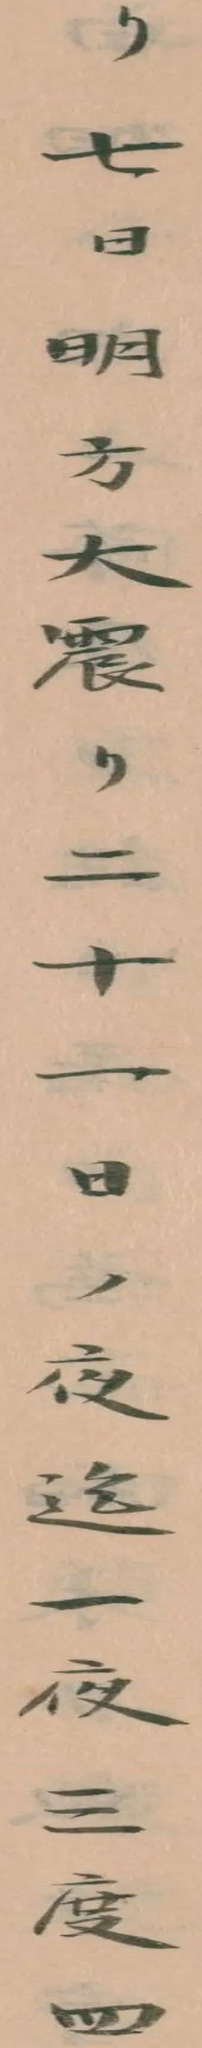リ七日明方大震リ二十一日ノ夜迄一夜三度四
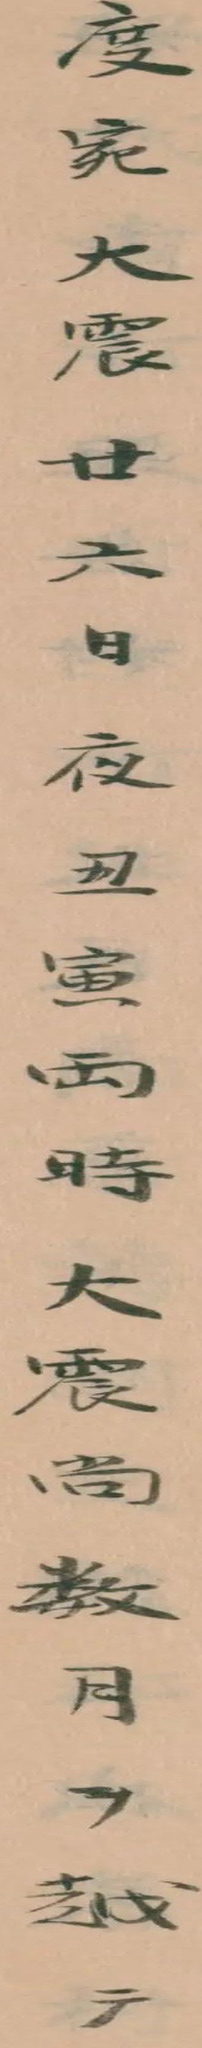度宛大震廿六日夜丑寅両時大震尚数月ヲ越テ
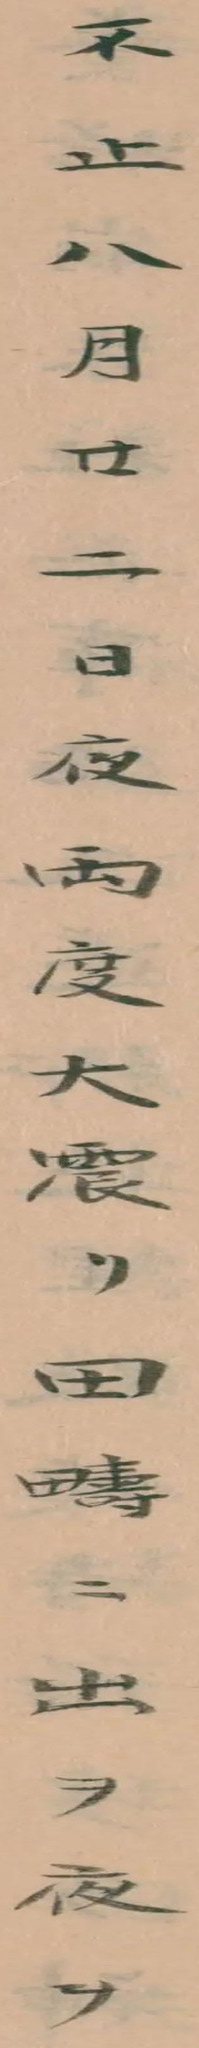不止八月廿二日夜両度大震リ田疇ニ出ヲ夜ヲ
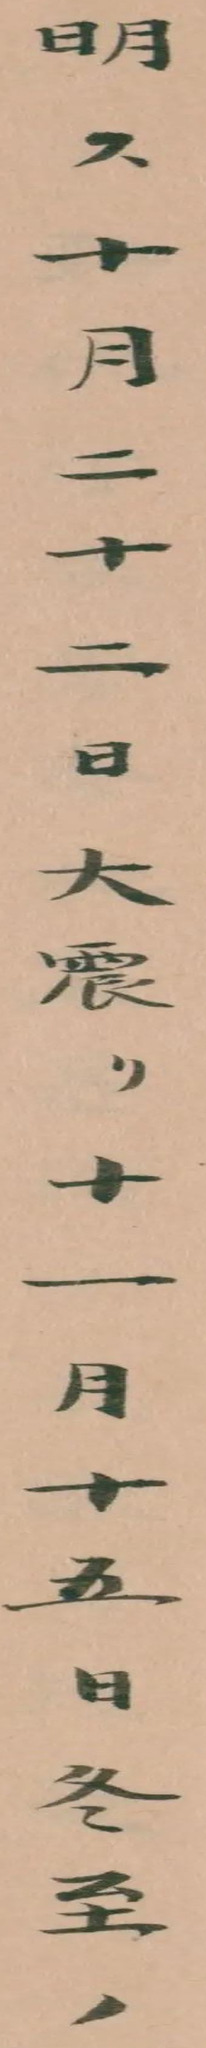明ス十月二十二日大震リ十一月十五日冬至ノ
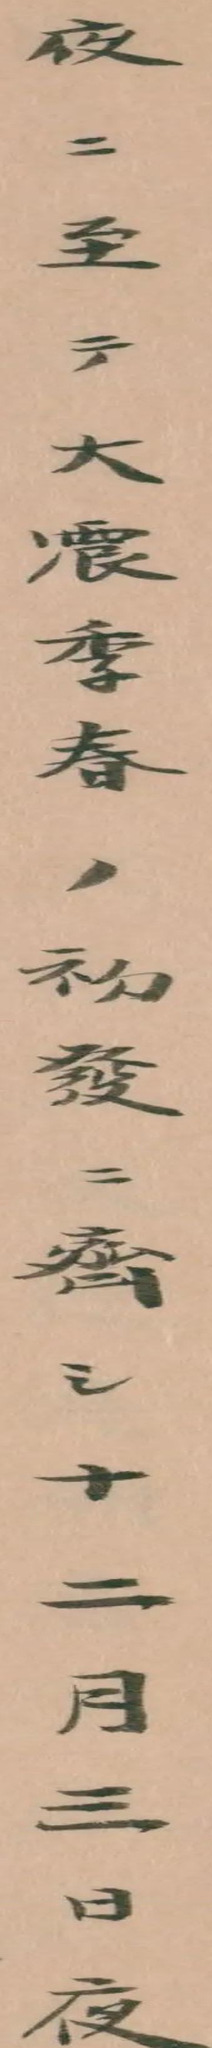夜ニ至テ大震季春ノ初発ニ齊シ十二月三日夜
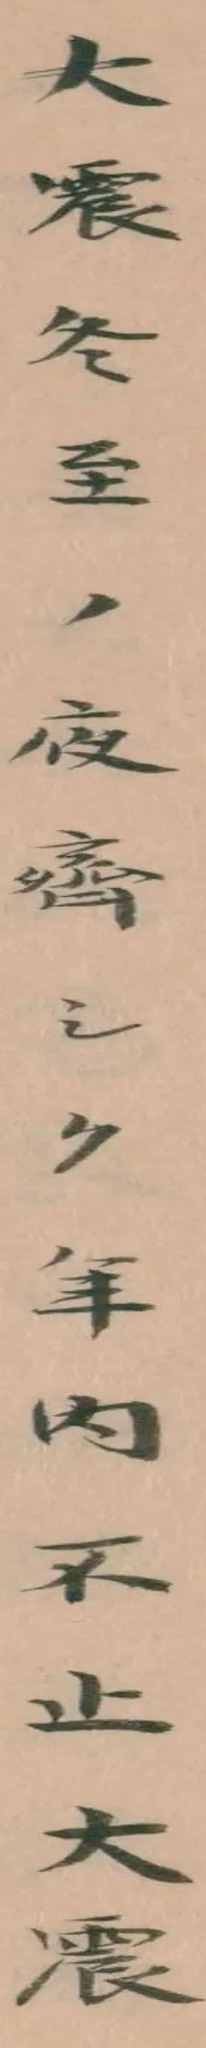大震冬至ノ夜齊シク年内不止大震

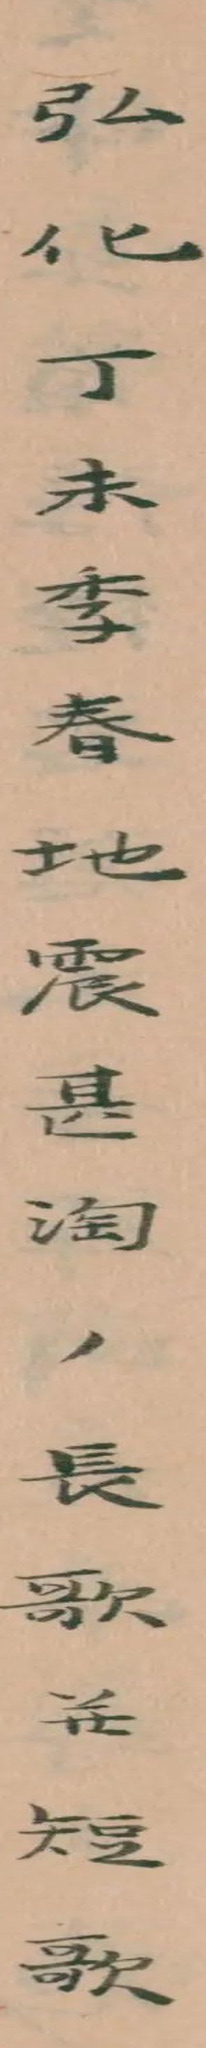弘化丁未季春地震甚淘ノ長歌并短歌
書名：地災撮要. 巻5-6(地震之部)
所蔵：国立国会図書館 National Diet Library, JAPAN
